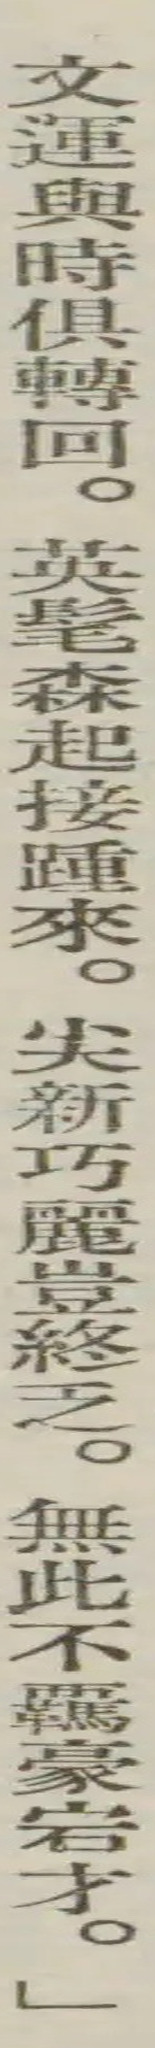文運与時倶転回。英髦森起接踵来。尖新巧麗豈終乏。無此不覊豪宕才。」
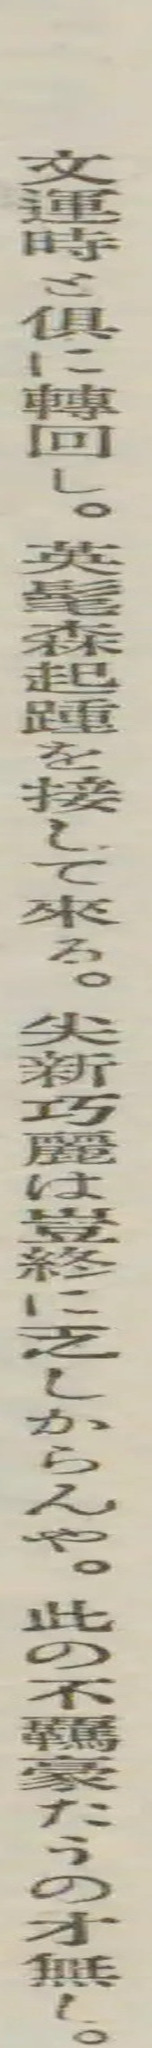文運時と倶に転回し。英髦森起踵を接して来る。尖新巧麗は豈終に乏しからんや。此の不覊豪たうの才無し。
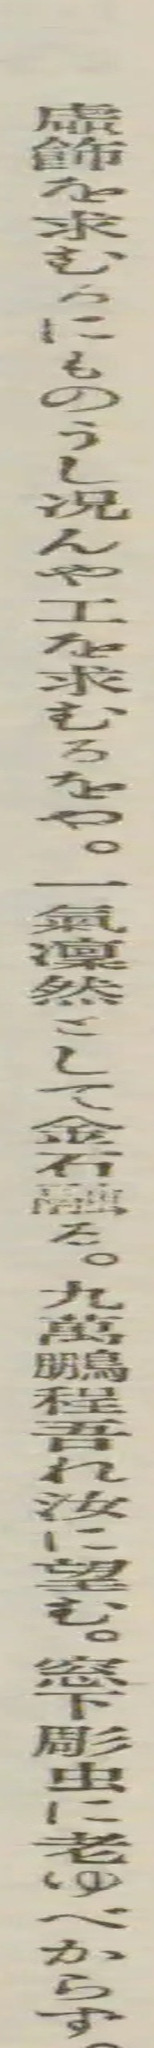虚飾を求むるにものうし況んや工を求むるをや。一気凛然として金石融る。九万鵬程吾れ汝に望む。窓下彫虫に老ゆべからず。
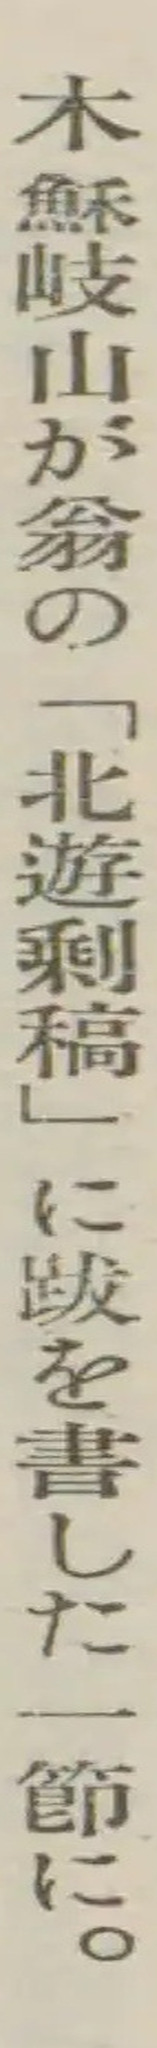木穌岐山が翁の「北遊剰稿」に跋を書した一節に。
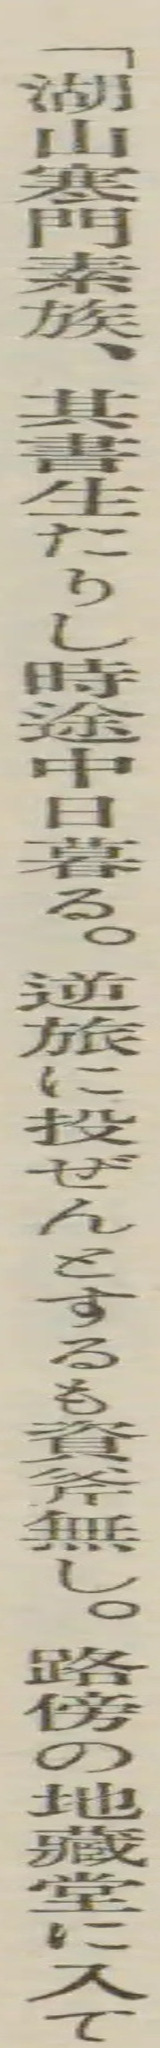「湖山寒門素族、其書生たりし時途中日暮る。逆旅に投ぜんとするも資斧無し。路傍の地蔵堂に入て

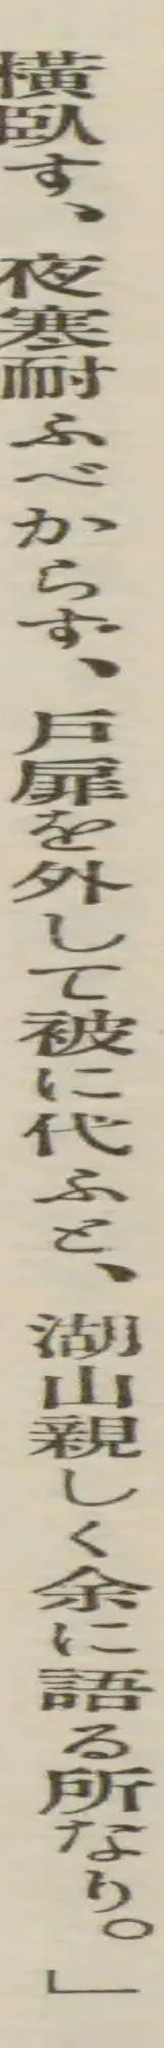横卧す、夜寒耐ふべからず、戸扉を外して被に代ふと、湖山親しく余に語る所なり。」
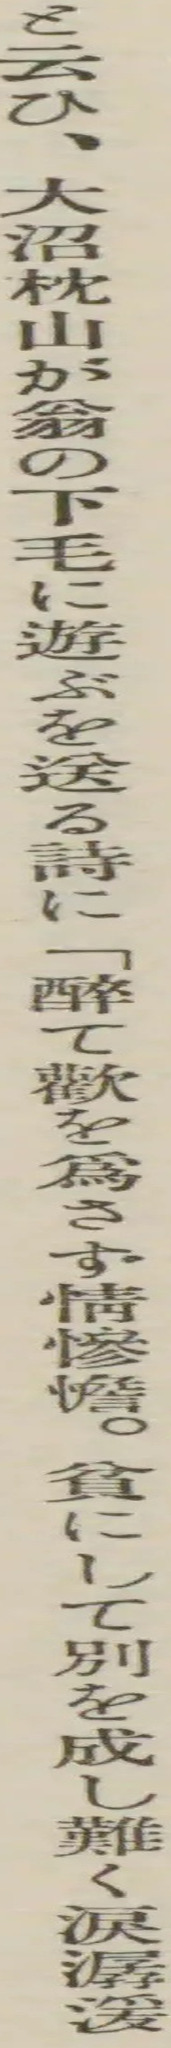と云ひ、大沼枕山が翁の下毛に遊ぶを送る詩に「酔て歓を為さず情惨憺。貧にして別を成し難く涙潺湲
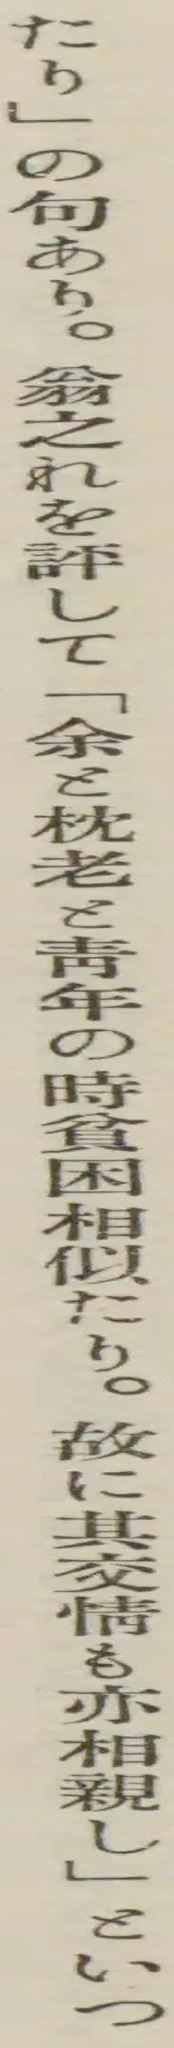たり」の句あり。翁之れを評して「余と枕老と青年の時貧困相似たり。故に其交情も亦相親し」といつ
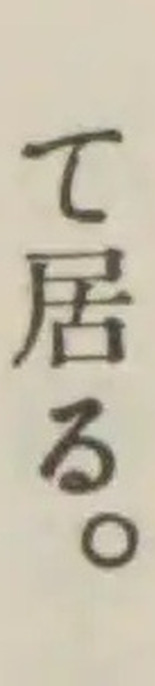て居る。
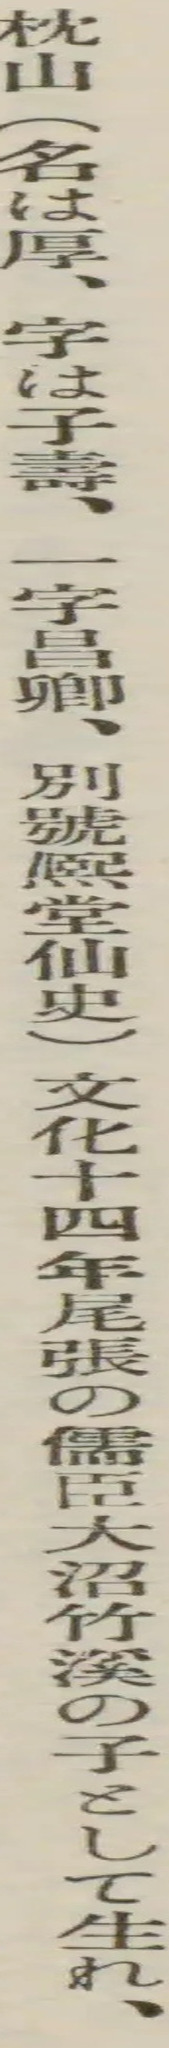枕山(名は厚、字は子壽、一字昌卿、別号煕堂仙史)文化十四年尾張の儒臣大沼竹溪の子として生れ、
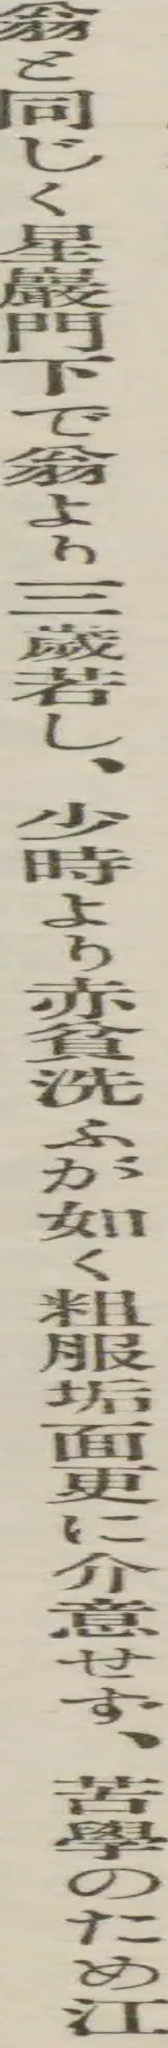翁と同じく星巌門下で翁より三歳若し、少時よ赤貧洗ふが如く粗服垢面更に介意せず、苦学のため江
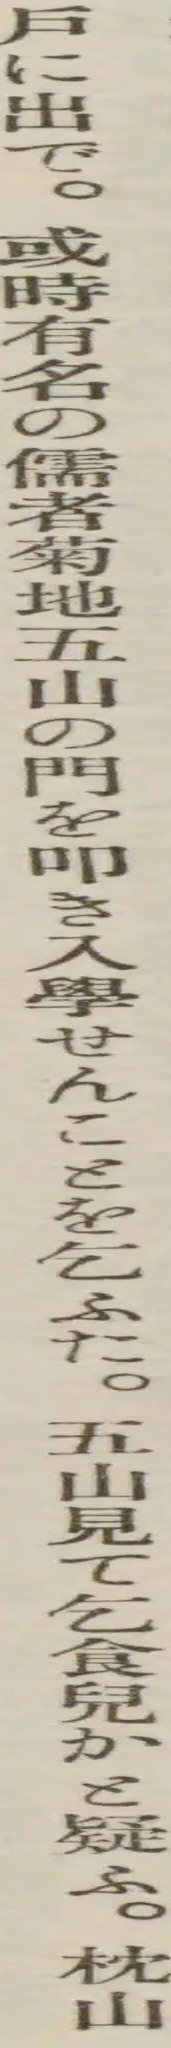戸に出で。或時有名の儒者菊池五山の門を叩き入学せんことを乞ふた。五山見て乞食児かと疑ふ。枕山
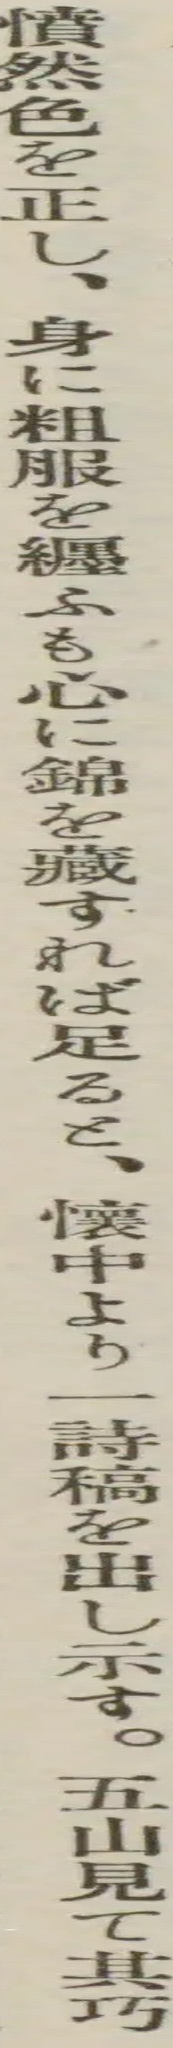憤然色を正し、身に粗服を纏ふも心に錦を蔵すれば足ると、懐中より一詩稿を出し示す。五山見て其巧
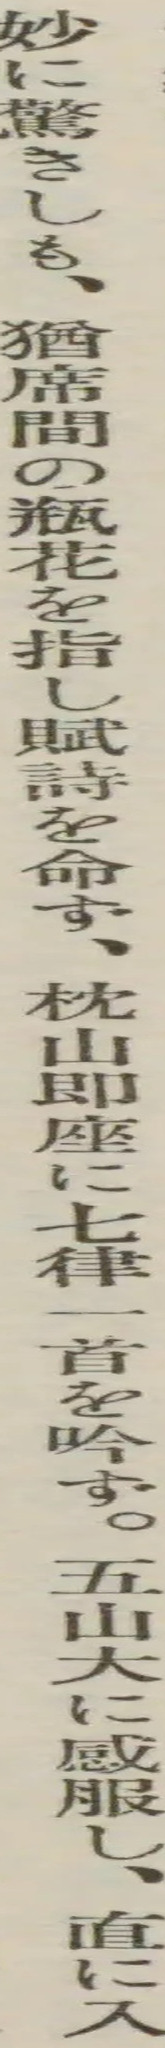妙に驚きしも、猶席間の瓶花を指し賦詩を命ず、枕山即座に七律一首を吟ず。五山大に感服し、直に入
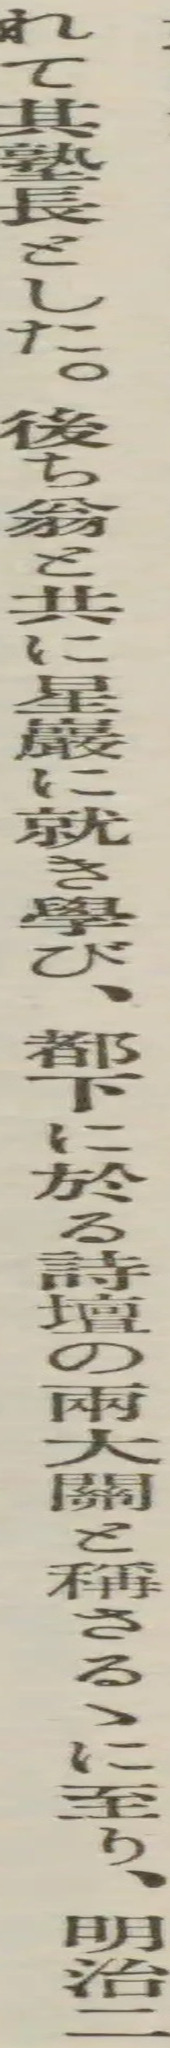れて其塾長とした。後ち翁と共に星巌に就き学び、都下に於る詩壇の両大関と称さるゝに至り、明治二
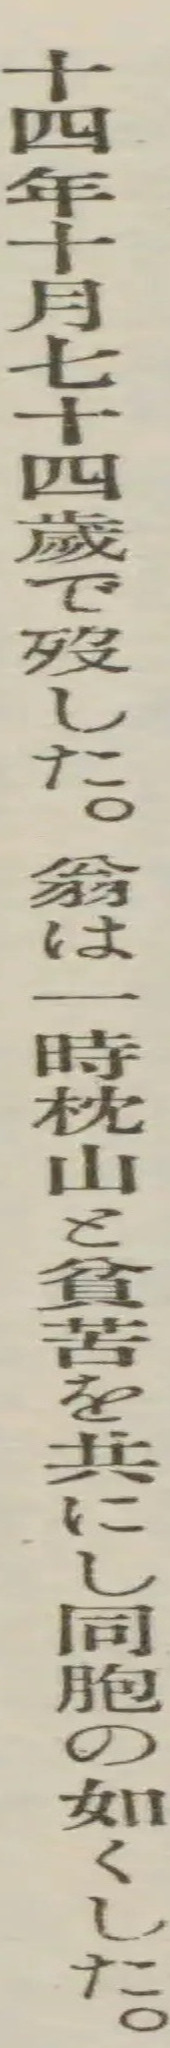十四年十月七十四歳で歿した。翁は一時枕山と貧苦を共にし同胞の如くした。
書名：小野湖山翁小伝
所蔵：国立国会図書館 National Diet Library, JAPAN
